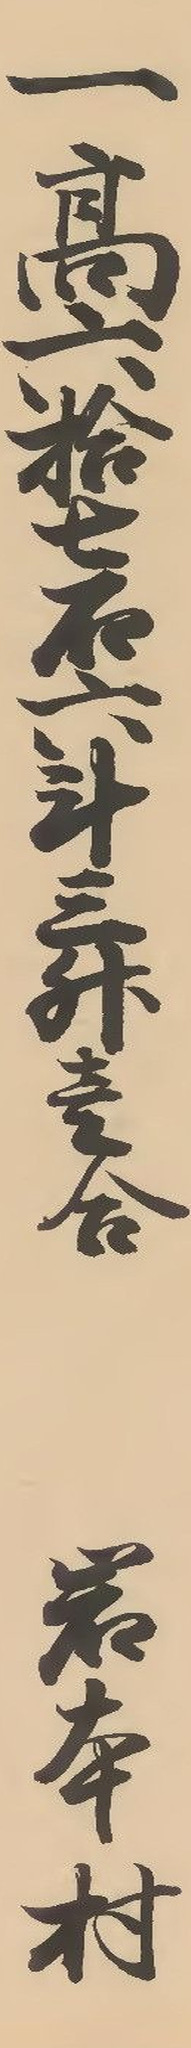一高六拾七石六斗三升壱合岩本村
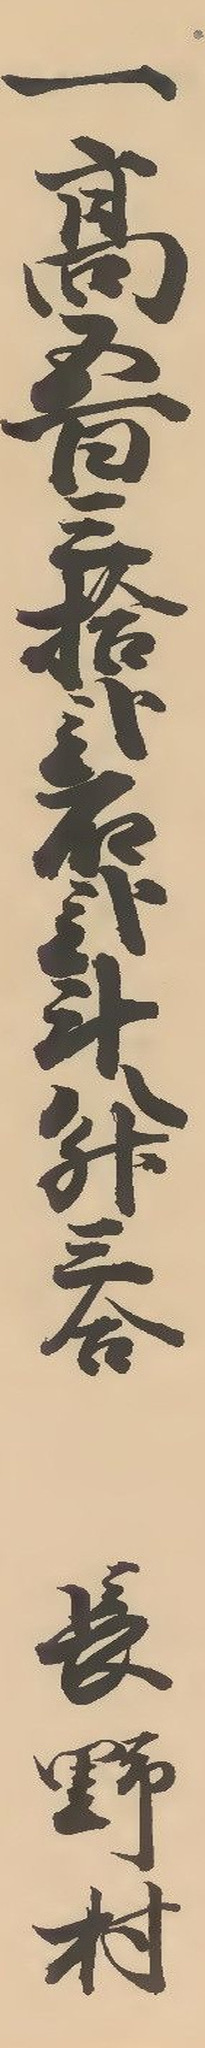一高五百三拾弐石弐斗八升三合長野村
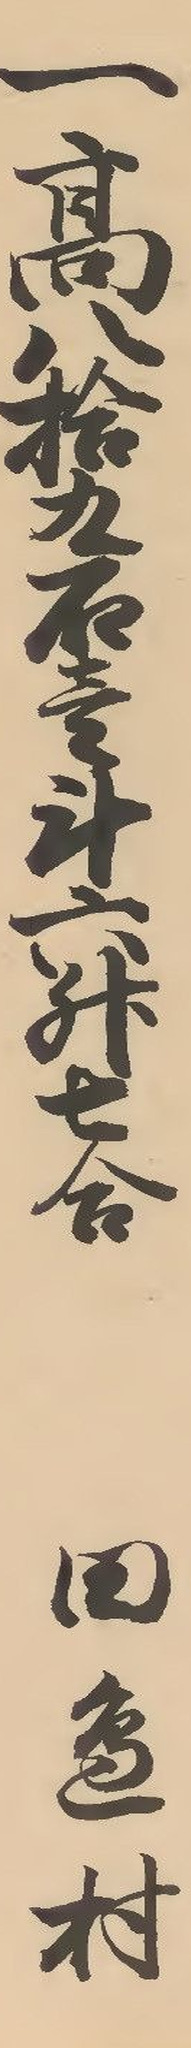一高八拾九石壱斗六升七合田辺村

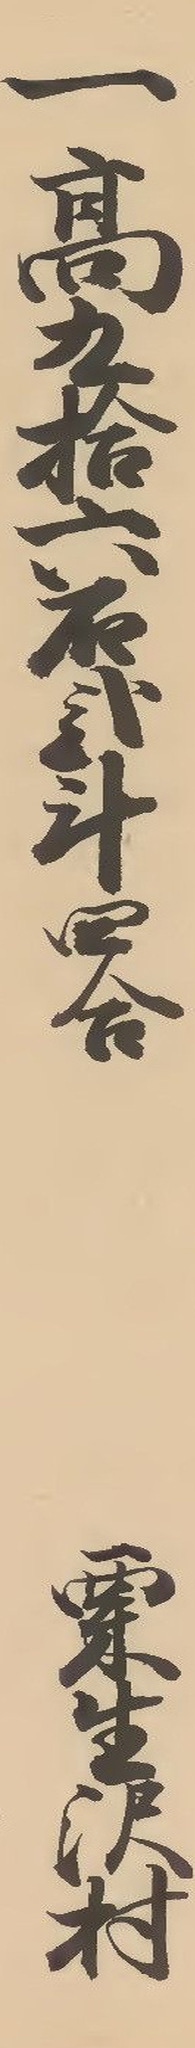一高九拾六石弐斗四合栗生沢村
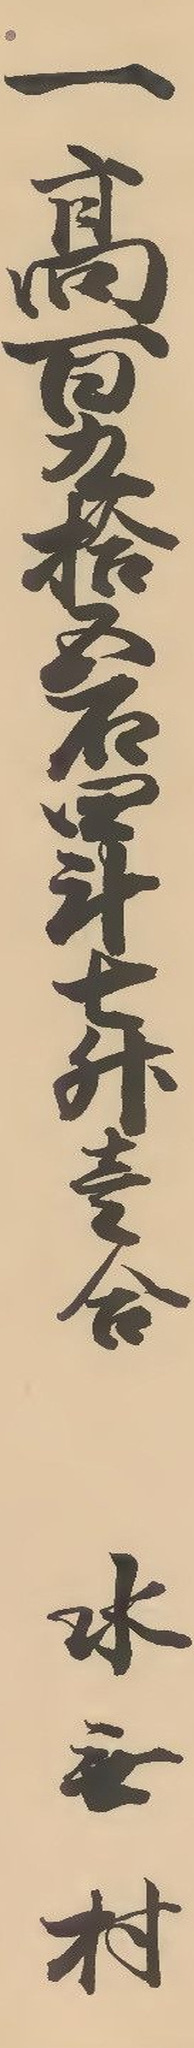一高百九拾五石四斗七升壱合水無村
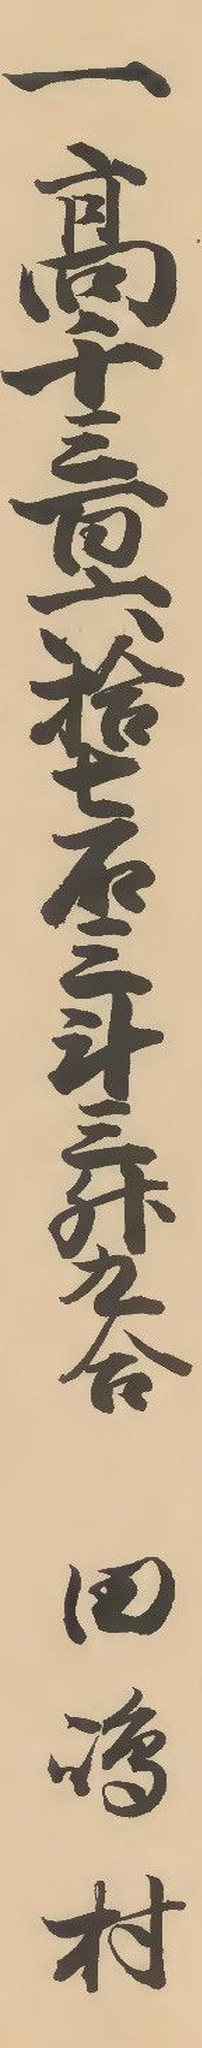一高千三百六拾七石三斗三升九合田島村
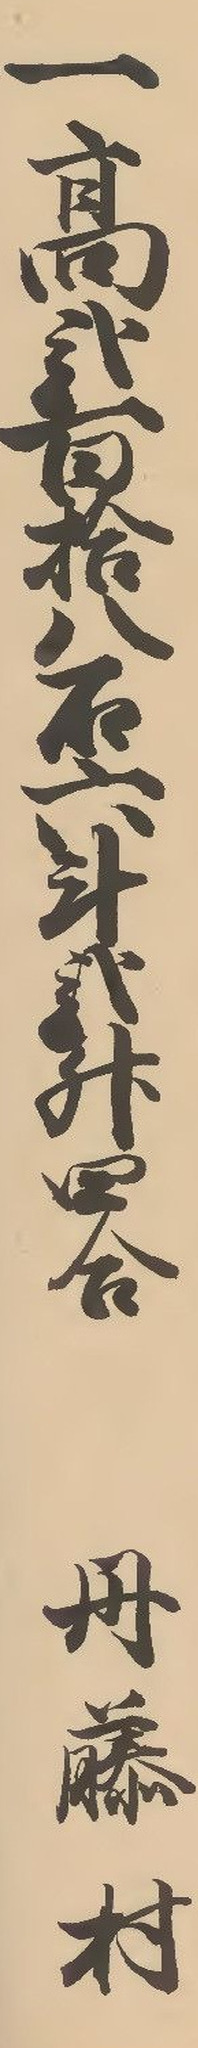一高弐百拾八石六斗弐升四合丹藤村
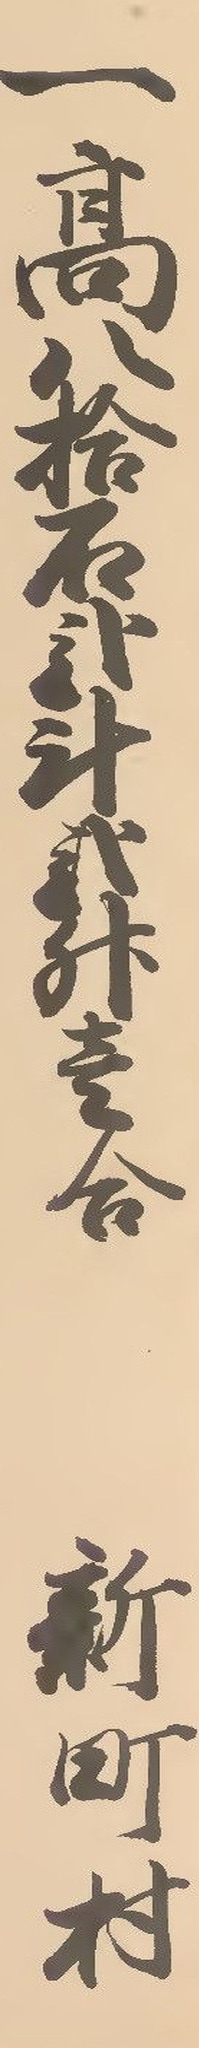一高八拾石弐斗弐升壱合新町村
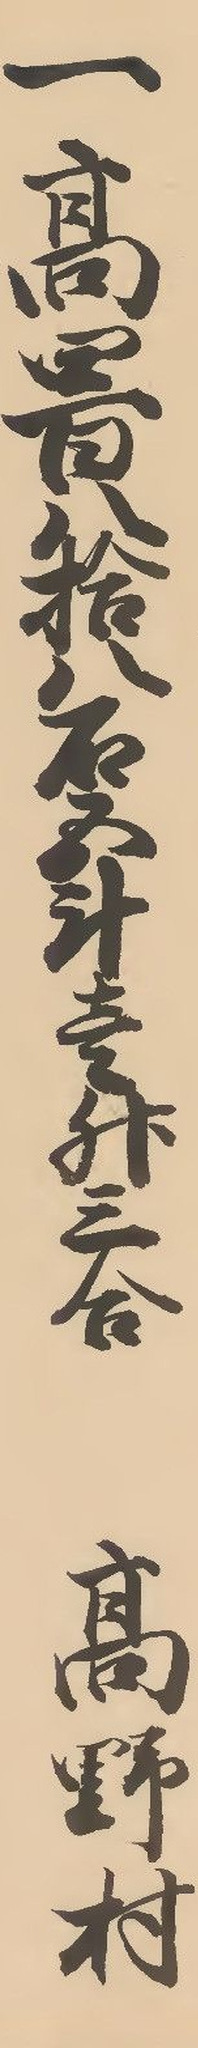一高四百八拾八石五斗壱升三合高野村
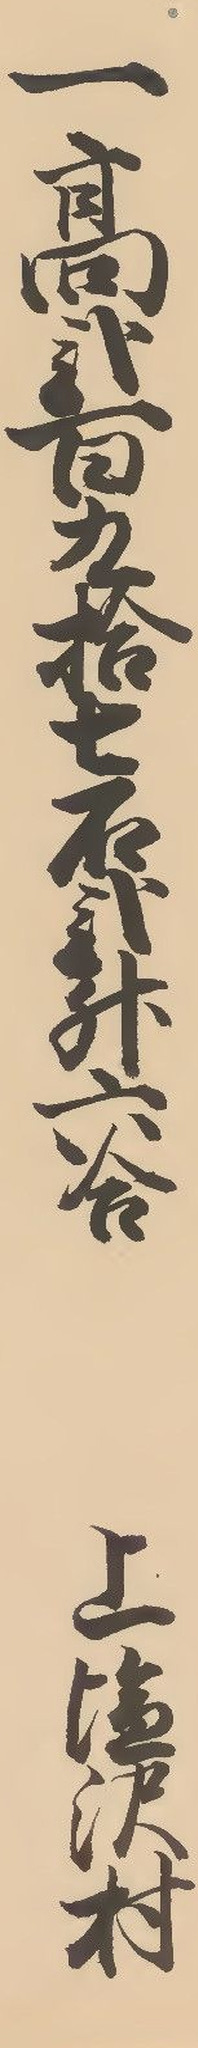一高弐百九拾七石弐升六合上塩沢村
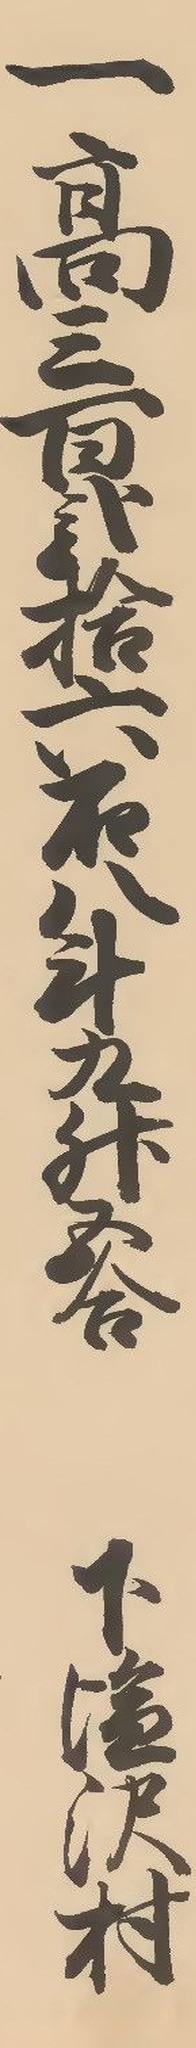一高三百弐拾六石八斗九升五合下塩沢村

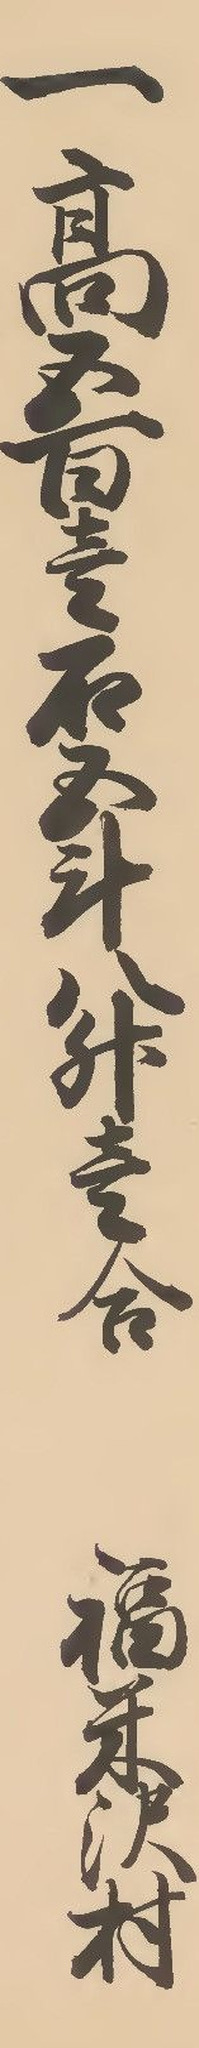一高五百壱石五斗八升壱合福米沢村
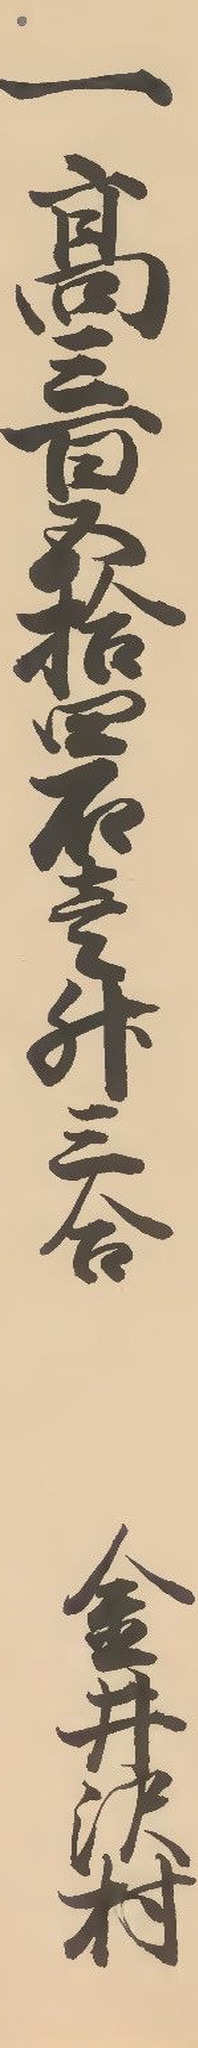一高三百五拾四石壱升三合金井沢村
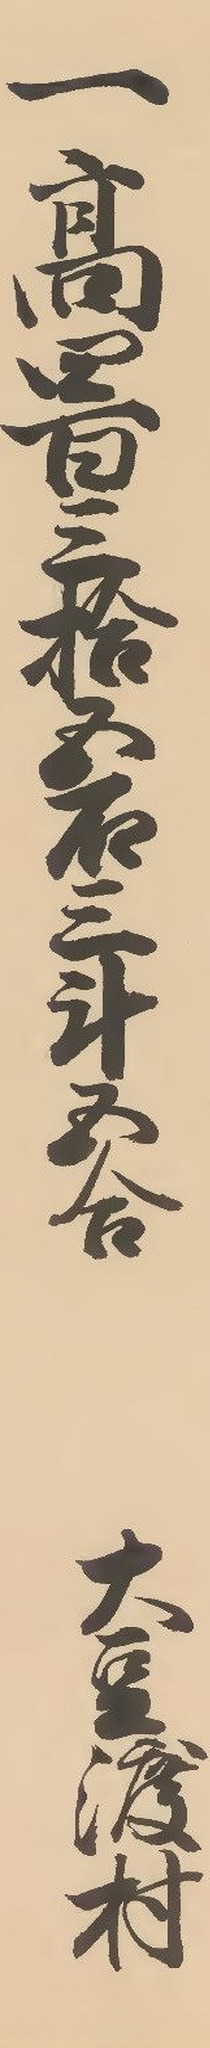一高四百三拾五石三斗五合大豆渡村
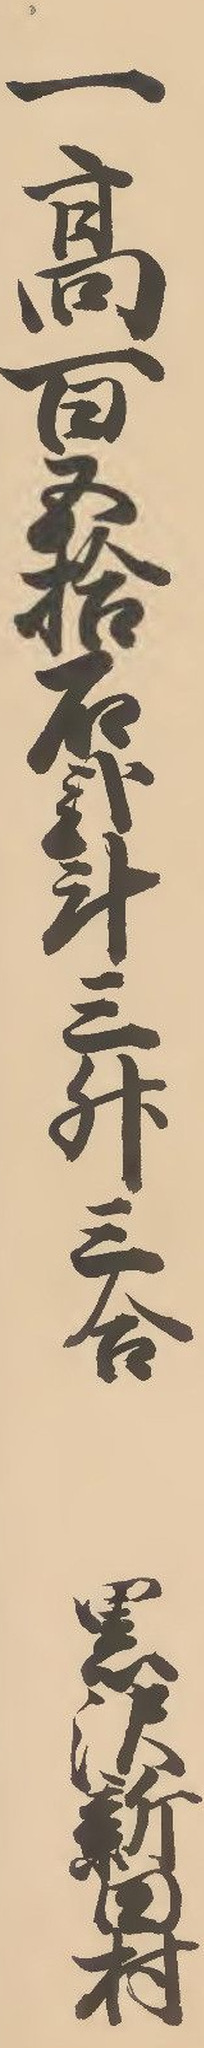一高百五拾石弐斗三升三合黒沢新田村
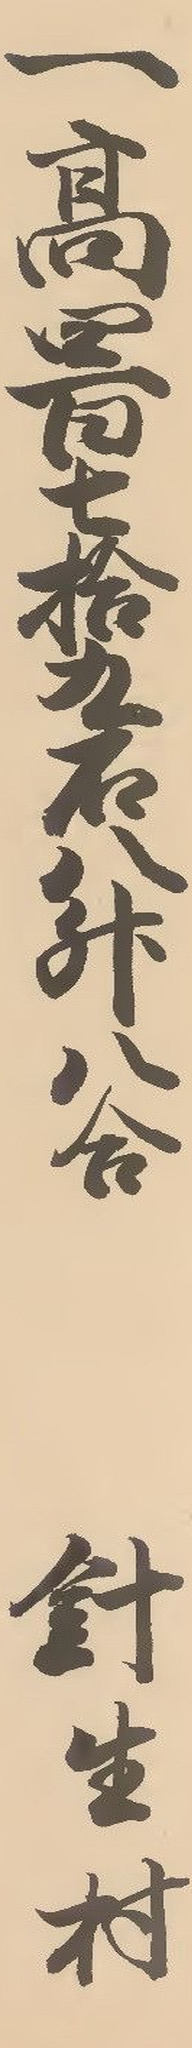一高四百七拾九石八升八合針生村
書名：陸奥国郷帳　１
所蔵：国立公文書館 National Archives of Japan
